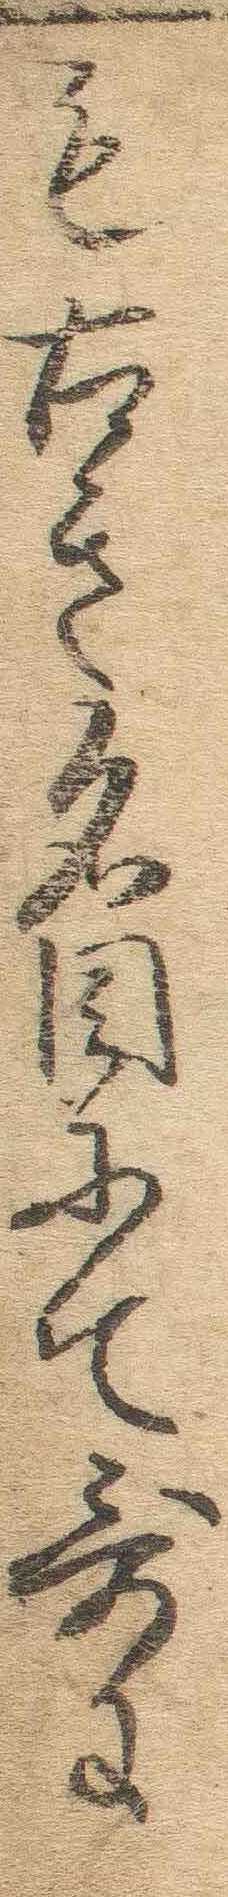も古き名目にて哥に

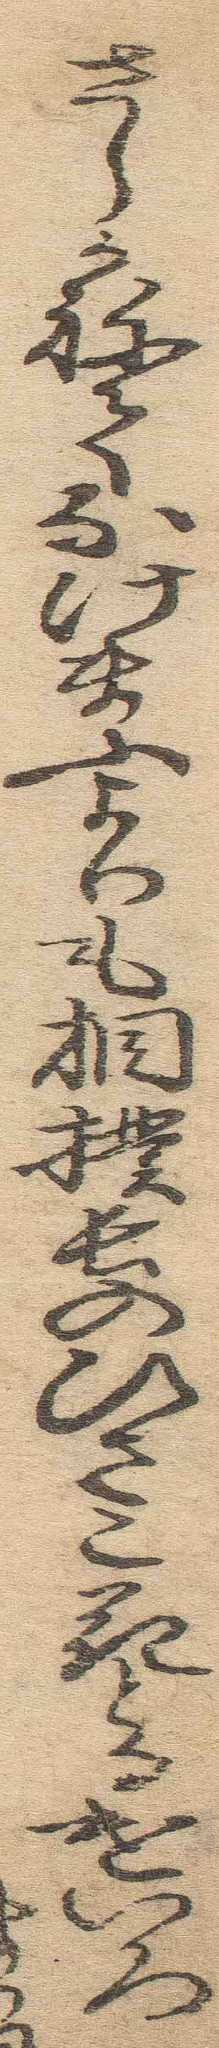さしかねてなけまふよりも相撲長のひさこ花とるけいろ
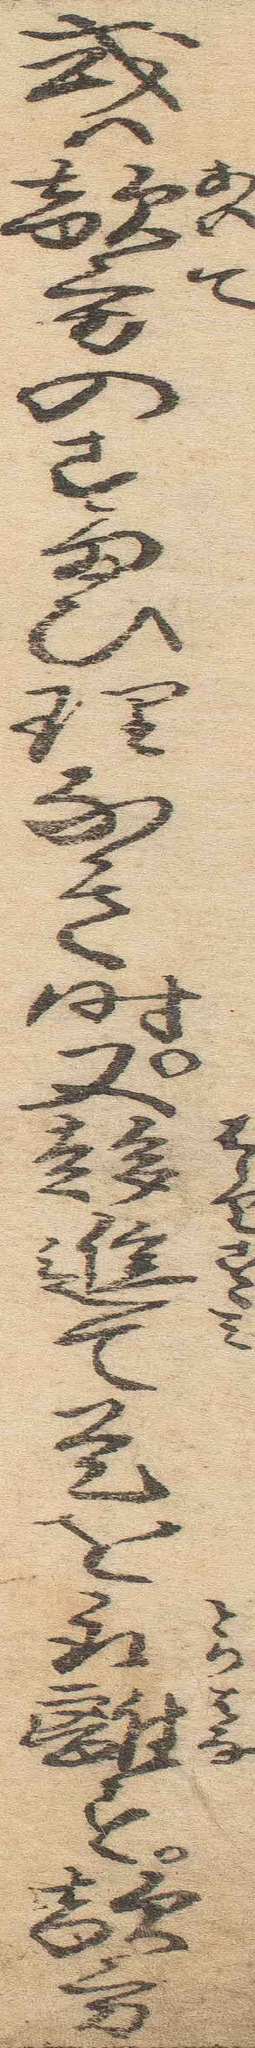或は敵方のすまひ理なき時。又趍進て是を取離す。敵方
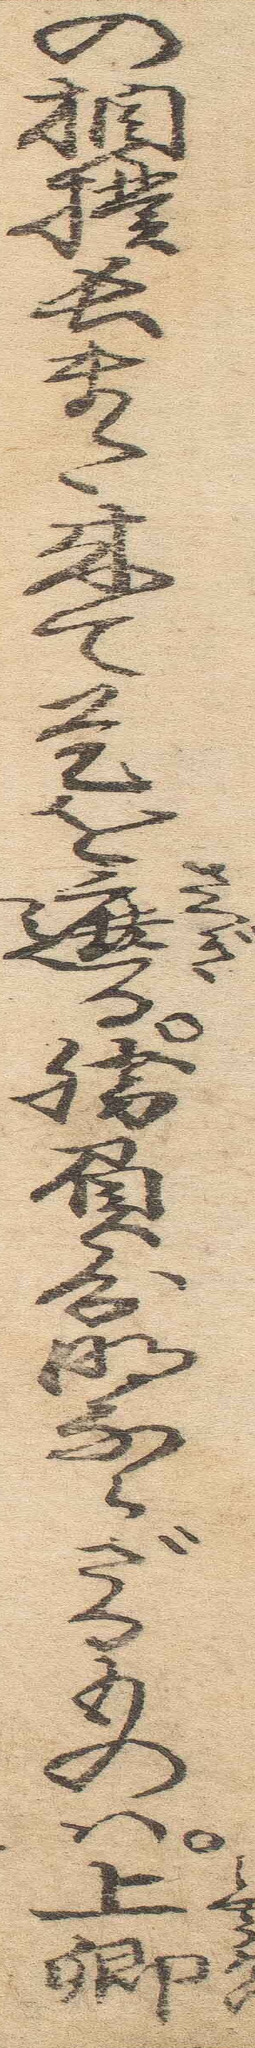の相撲長また来て是を遮る。勝負分明ならざるものは。上卿
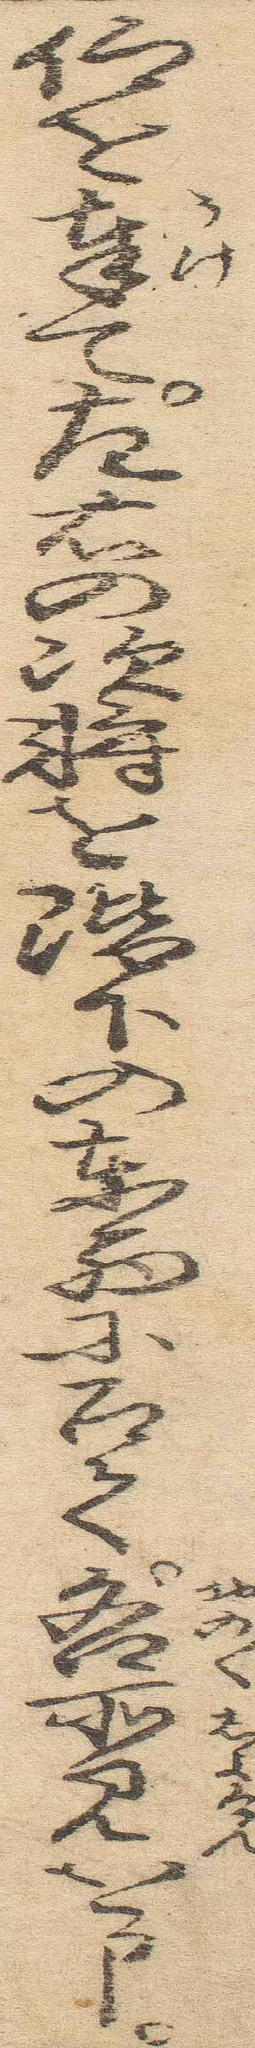仰を奉て。左右の次将を階下の東西に召て。各所見を申。
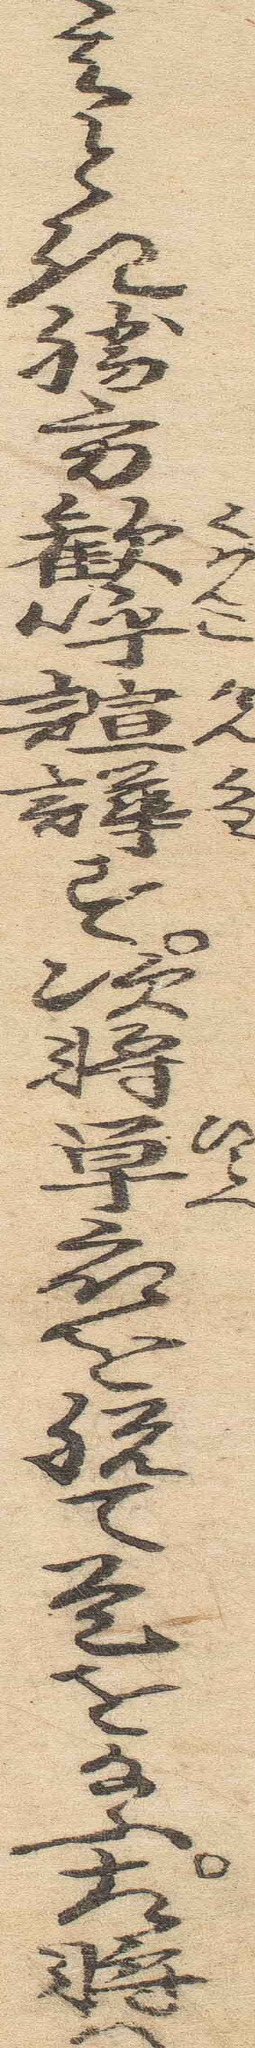其とき勝方歓呼諠譁す。次将単衣を脱て是を給ふ。左将は
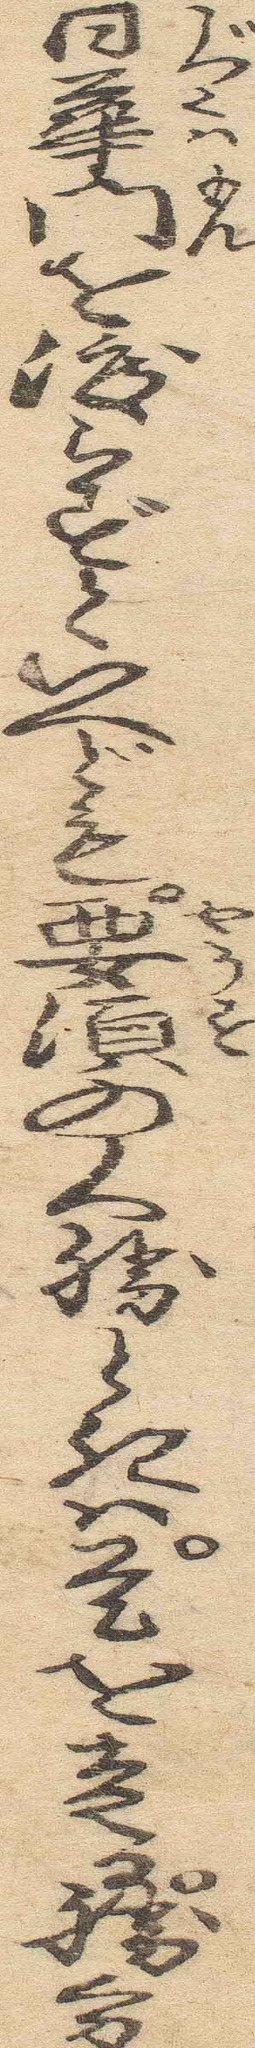日華門を渡らずといへども。要須の人勝ときは。是を走る。勝方
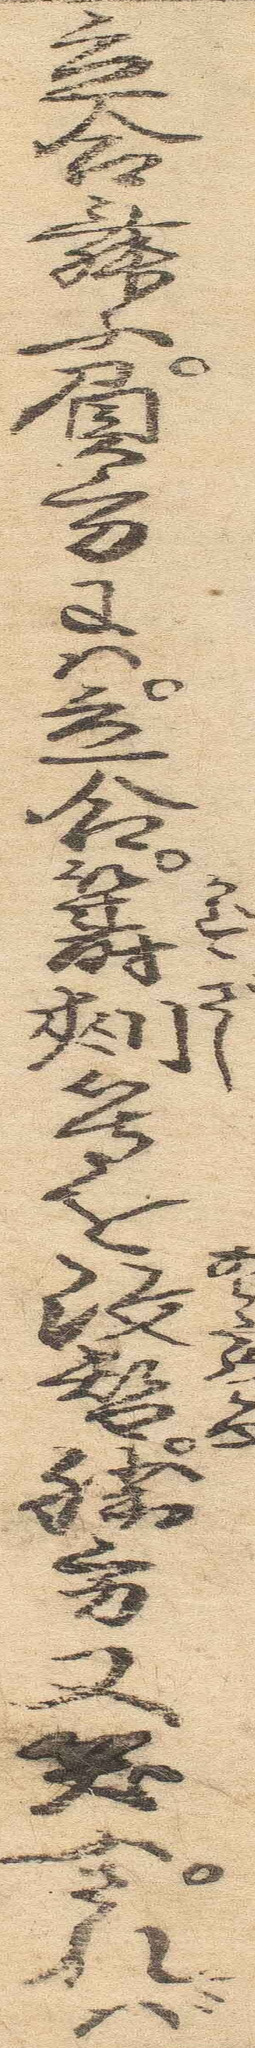立合舞ふ。負方には。立合。籌刺等を改替。勝方又笑ふ。されば
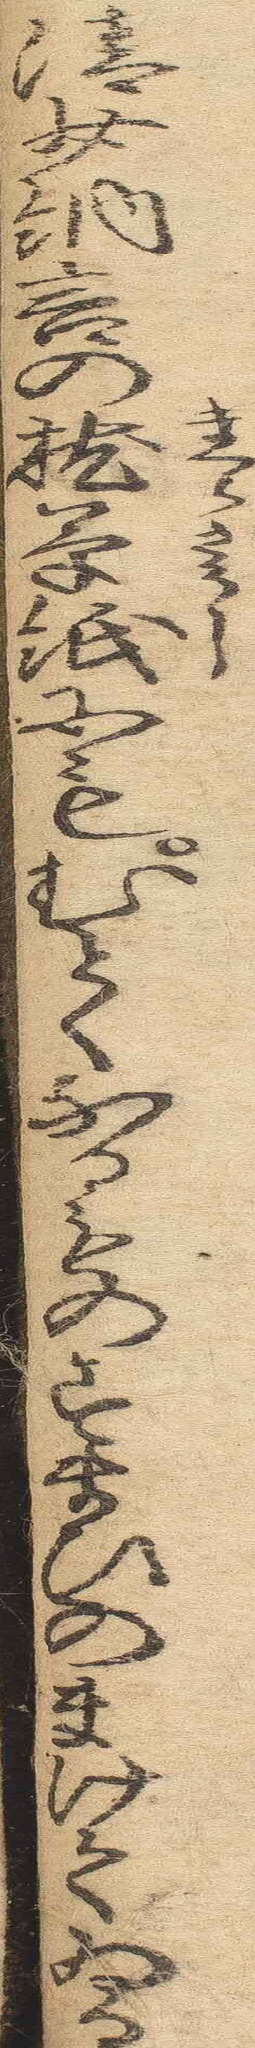清少納言の枕草紙にも。むとくなるものすまひのまけてゐる
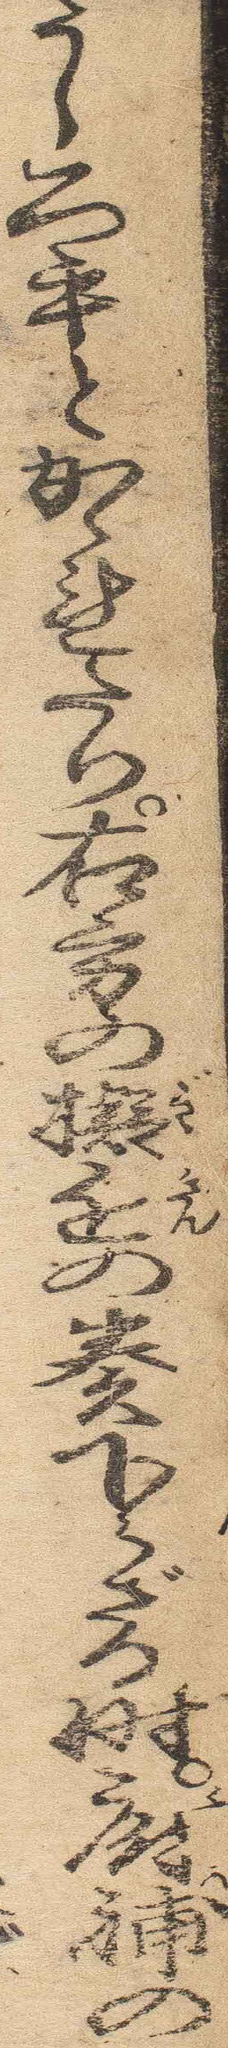うしろ手とかゝれたり。右方の擬近の奏下らざる時。府補の
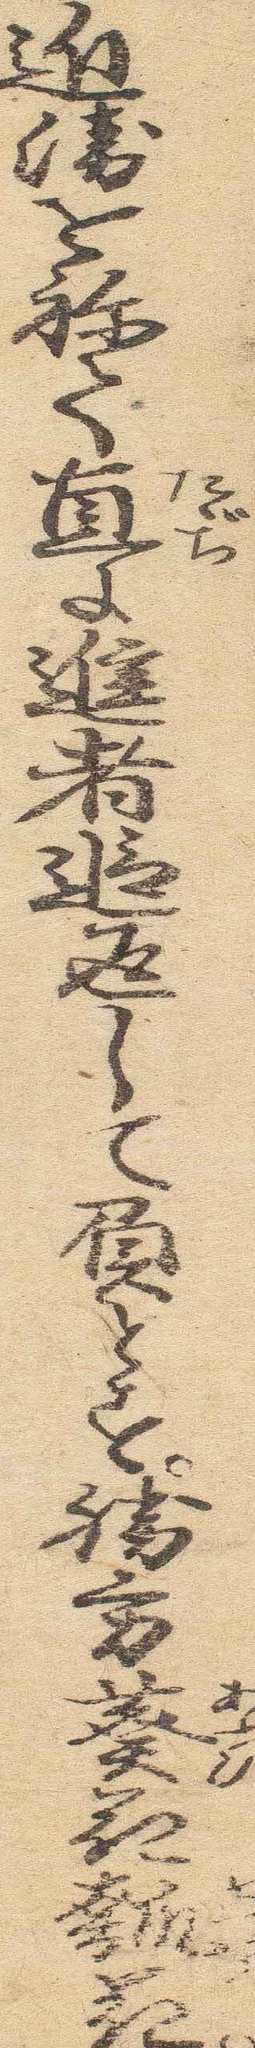近衛を称て直に進者追返して負とす。勝方葵花瓠花。
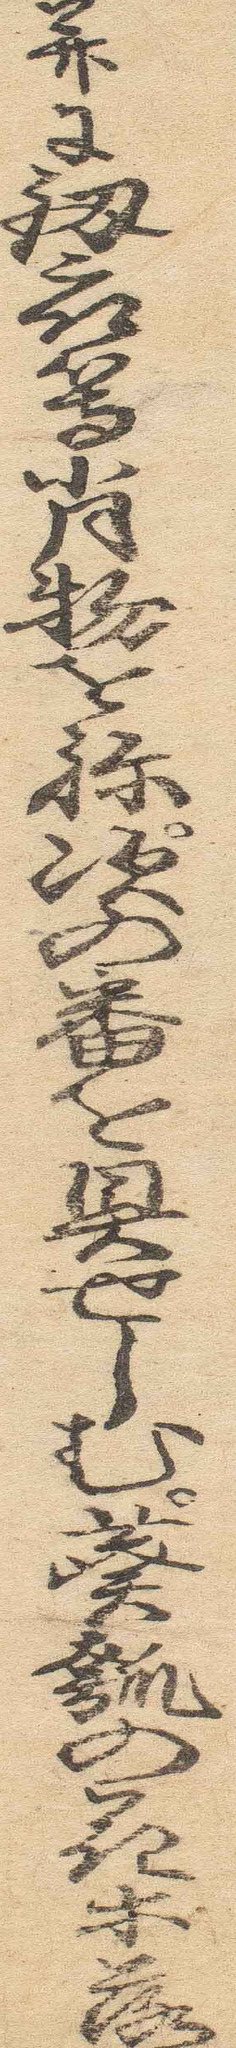并に剣衣等肖物を称。次の番を具せしむ。葵瓠の花木落
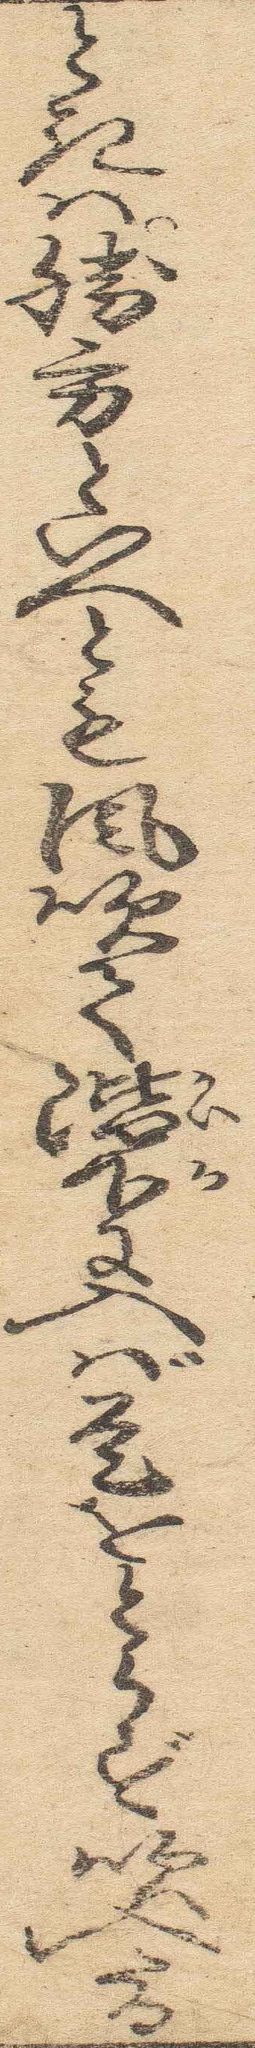ときは。勝方といへとも風吹て階下に入ば是をとらず吹入たる
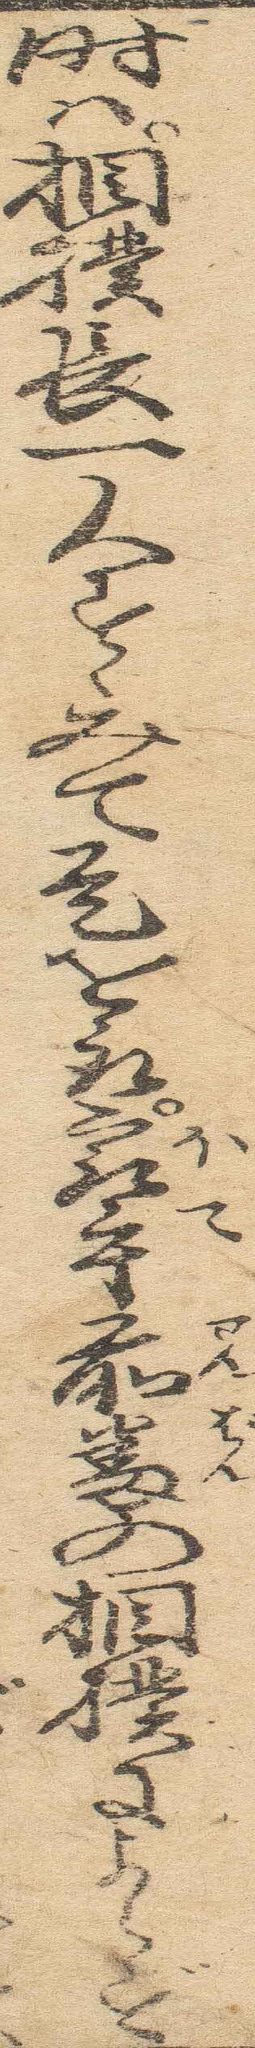時は。相撲長一人すゝみて是を取。最手前番の相撲によらず
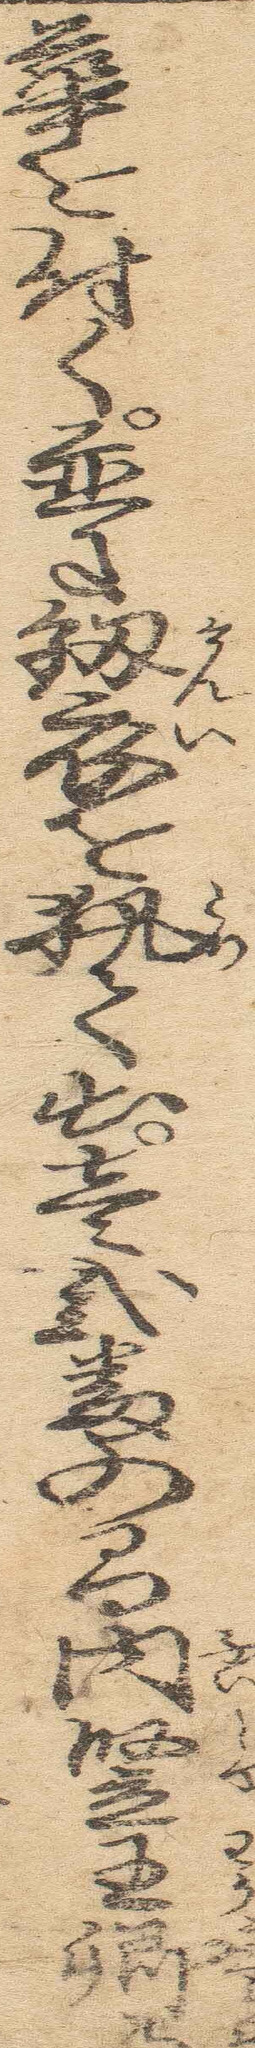華を付く。並に剣衣を執て出。壱弐番の間内豎王卿及
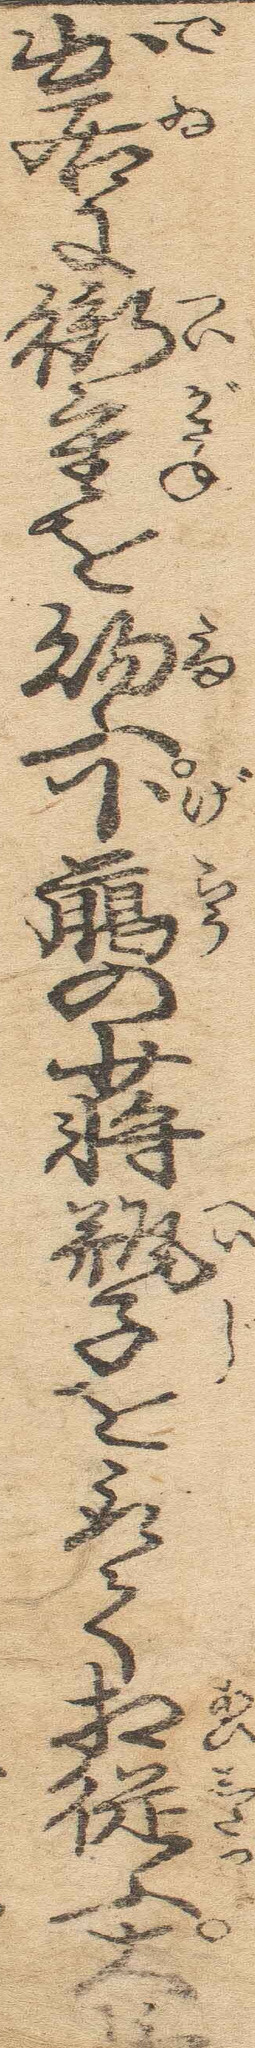出居に衝重を賜ふ。下﨟の少将瓶子を取て相従ふ。大臣よ
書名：古今相撲大全
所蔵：東京学芸大学附属図書館 国文学研究資料館
